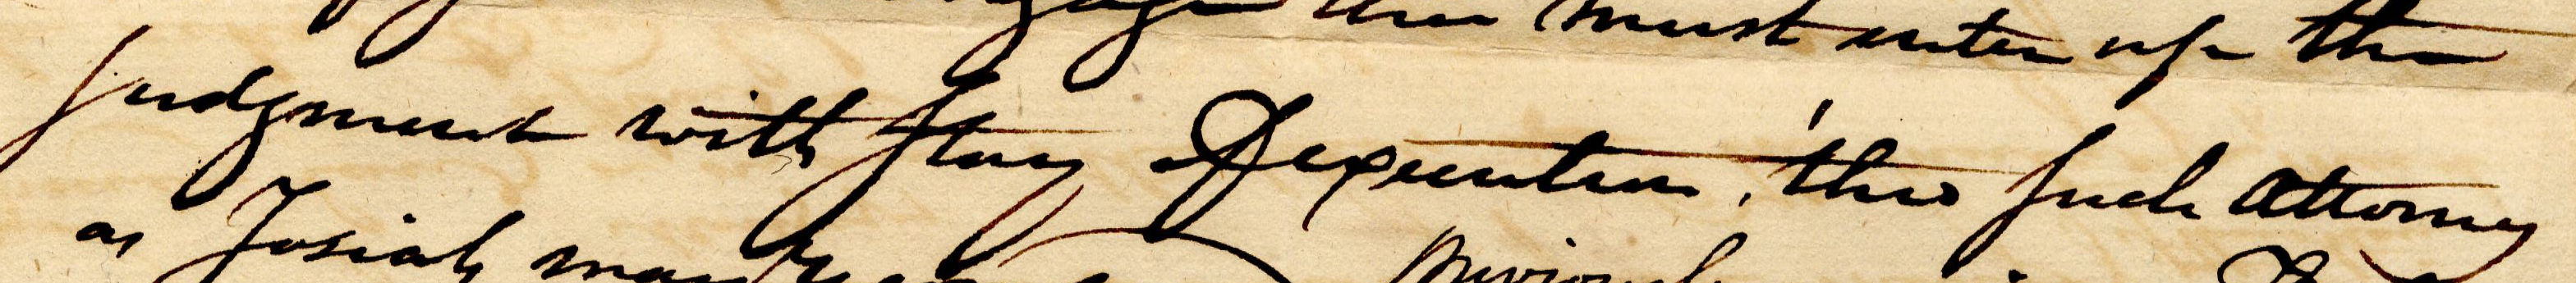judgment with stay of execution this such attorney
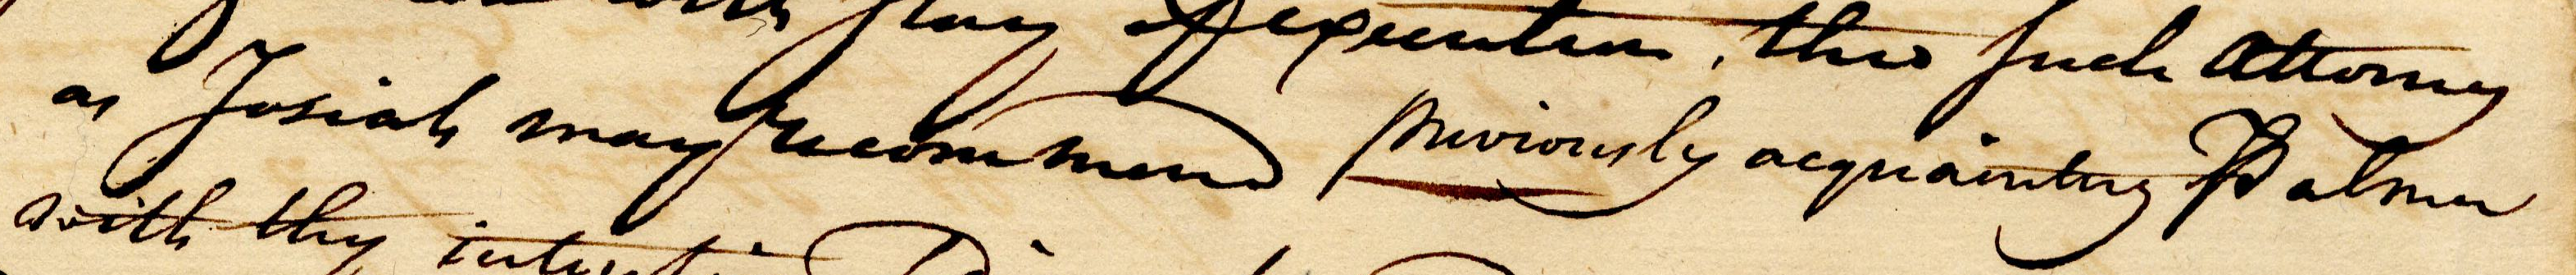as Josiah may recommend previously acquainting Palmer
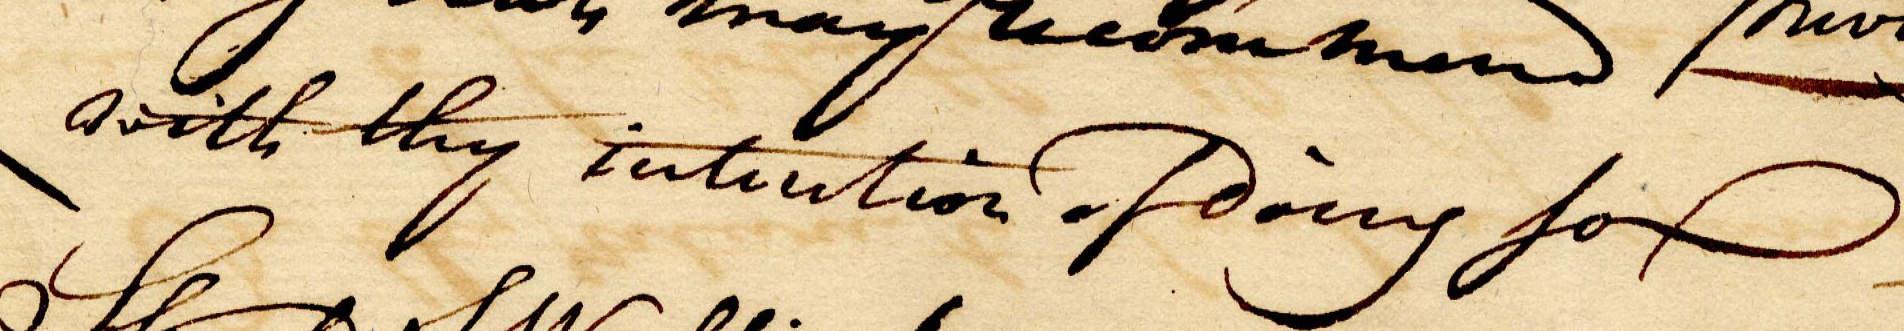with thy intention of doing so-
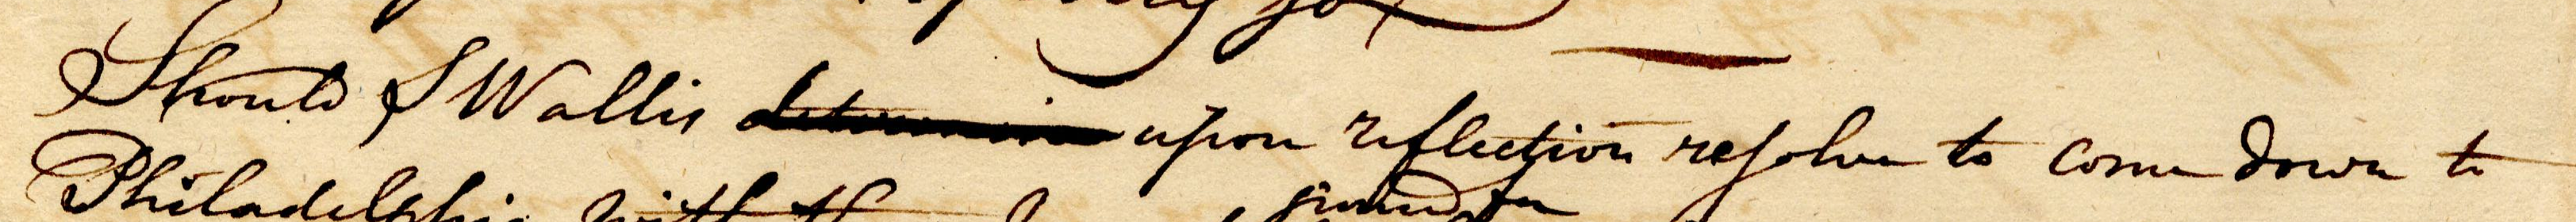Should S Wallis [determine] upon reflection resolve to come down to
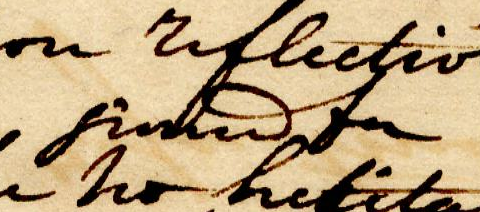pined for
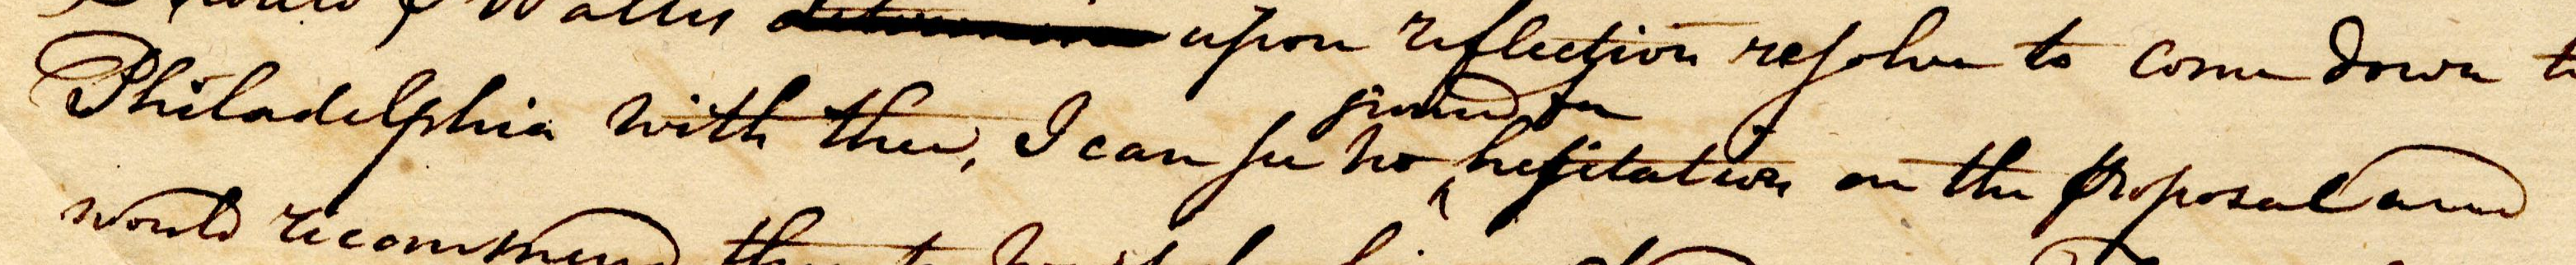Philadelphia with thee, I can see no ^ hesitation on the proposal and
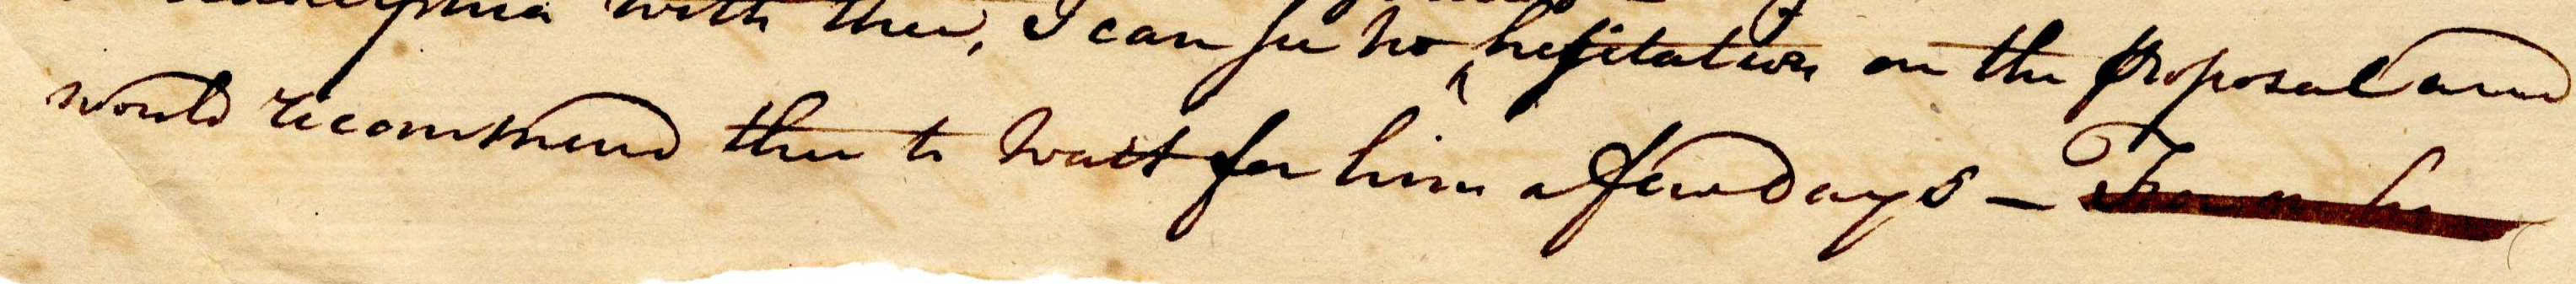would recommend thee to wait for him a few days- [__________]
